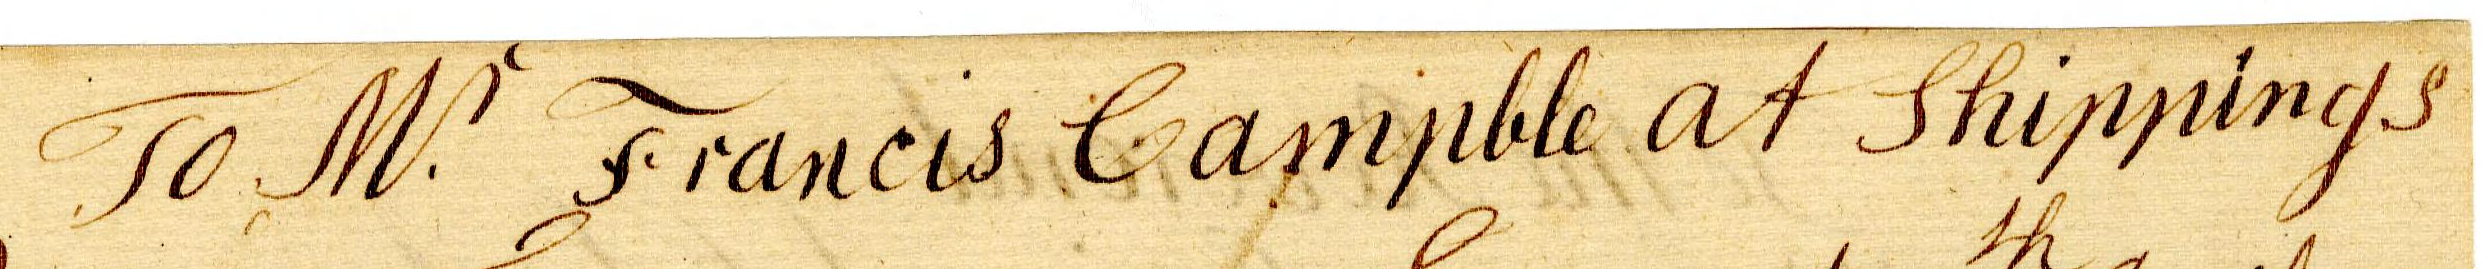To M^r. Francis Campble at Shippings
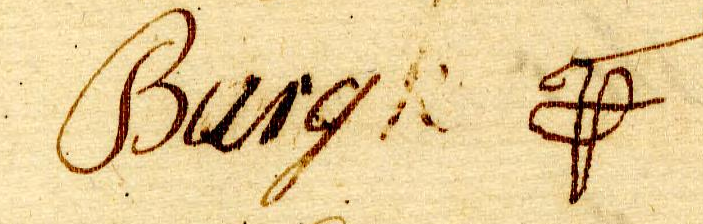Burg: per
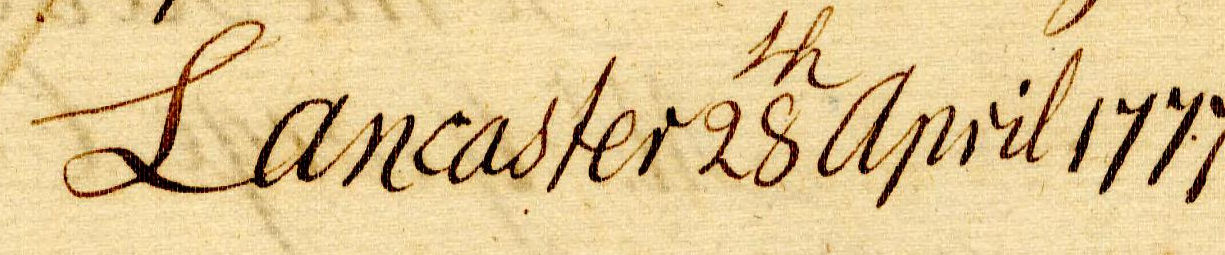Lancaster 28 April 1777
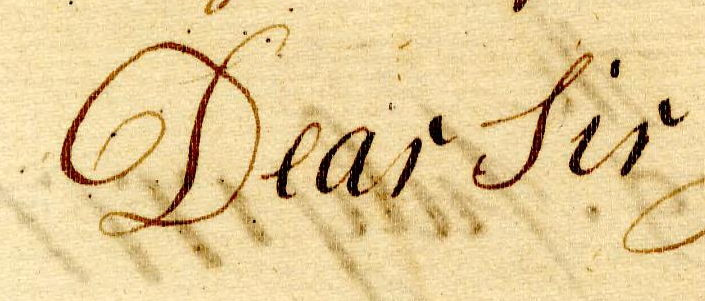Dear Sir
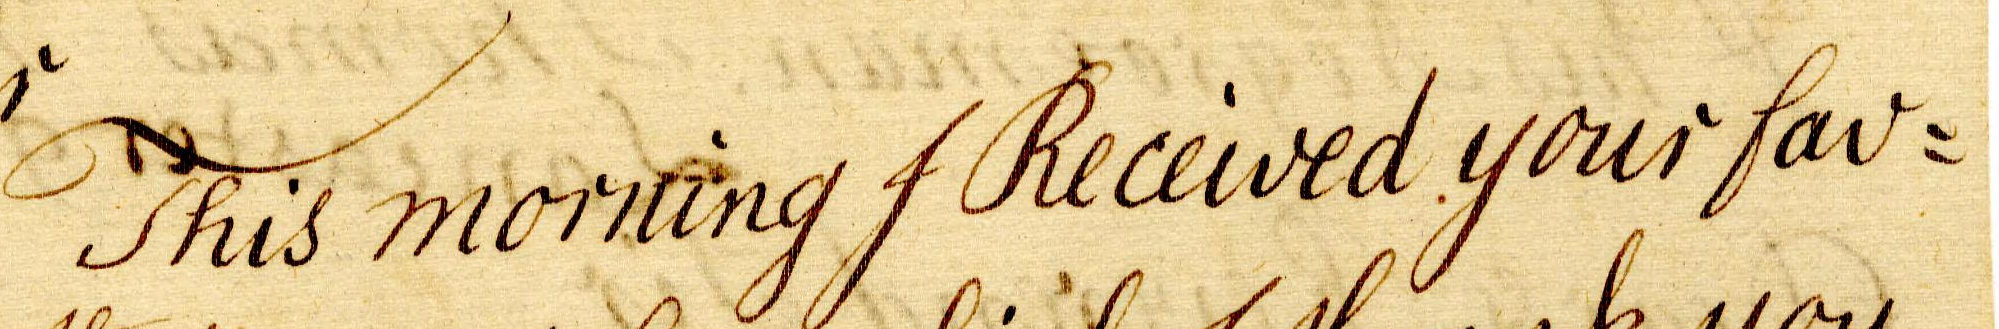This morning I Received your fav-
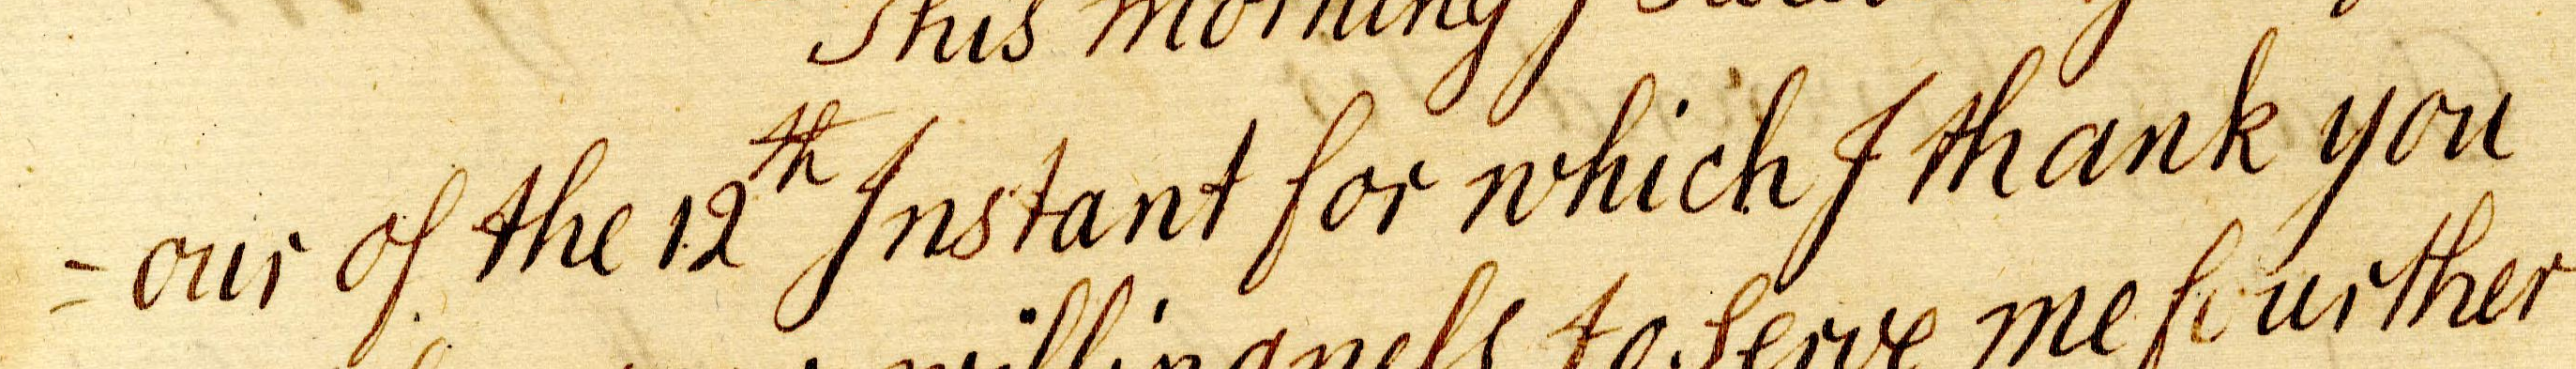-our of the 12^th Instant for which I thank you
